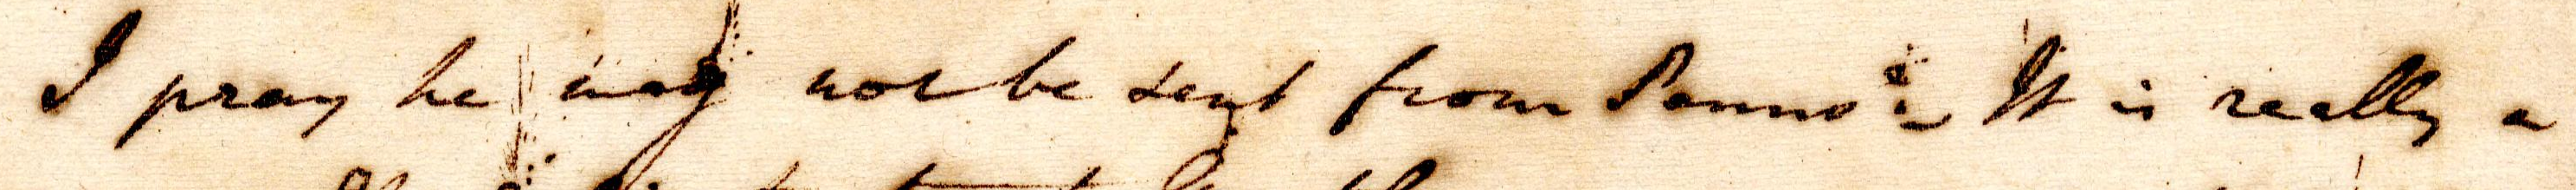I pray he may not be sent from Penns^a: It is really a
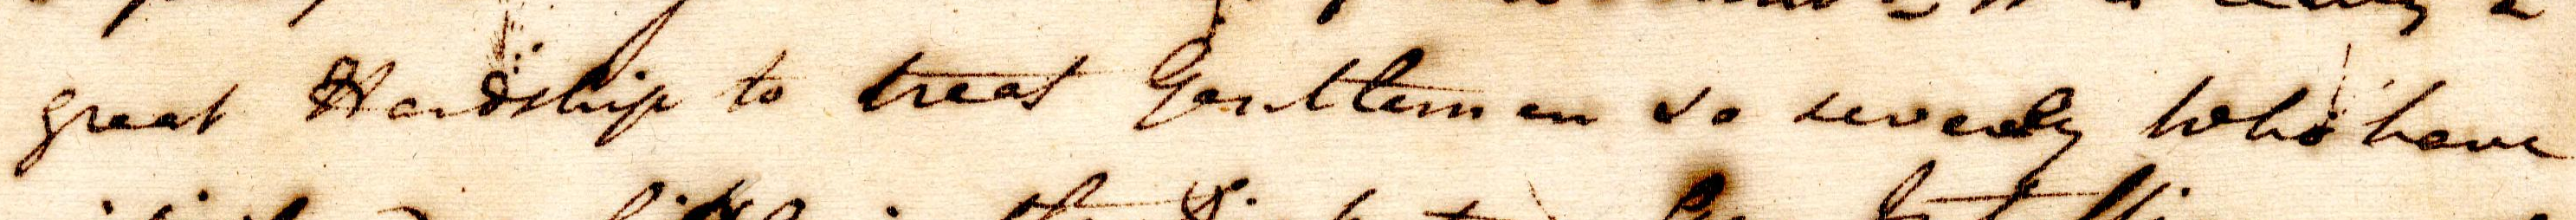great Hardship to treat Gentlemen so severely who have
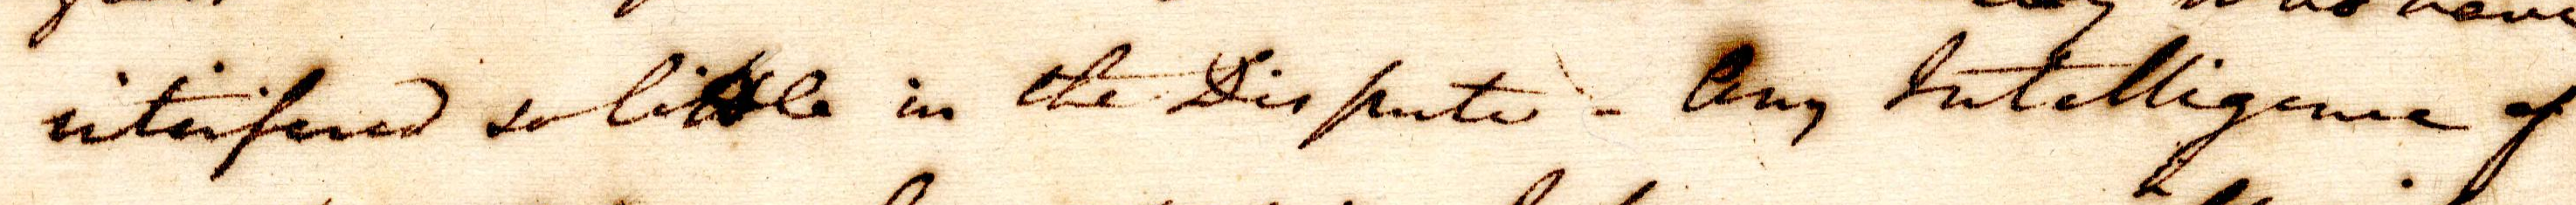interfered so little in the Dispute- Any Intelligence of
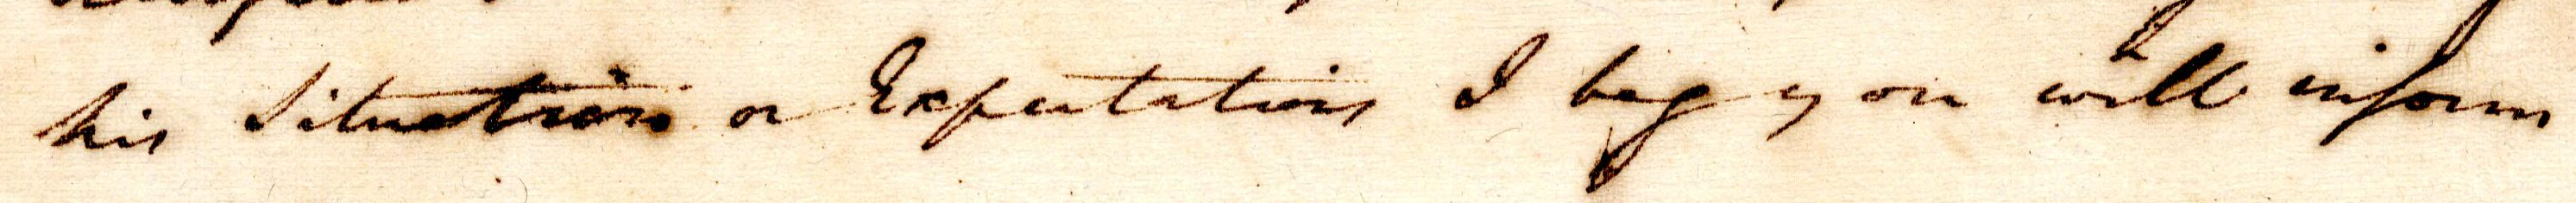his Situation or Expectations I beg you will inform
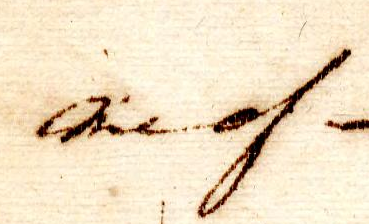me of-
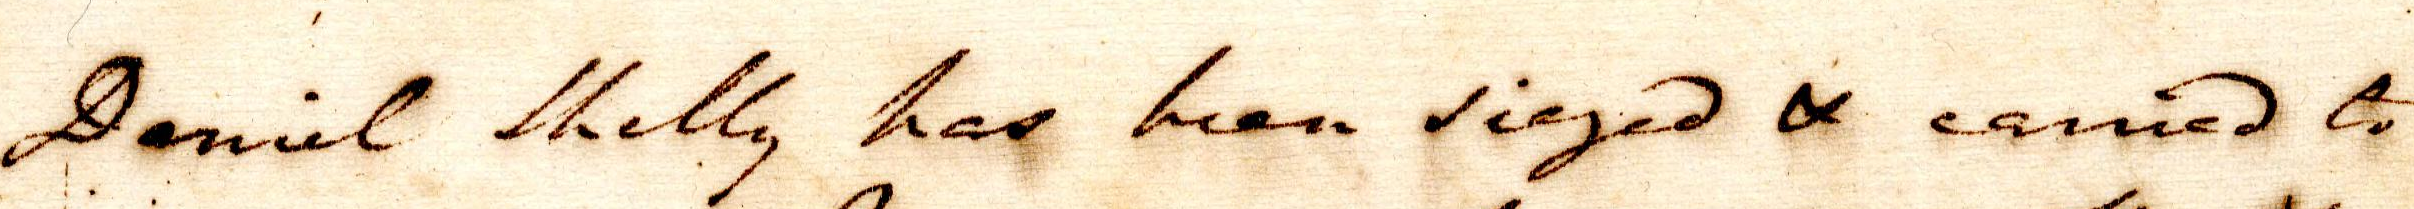Daniel Shelly has been siezed & carried to
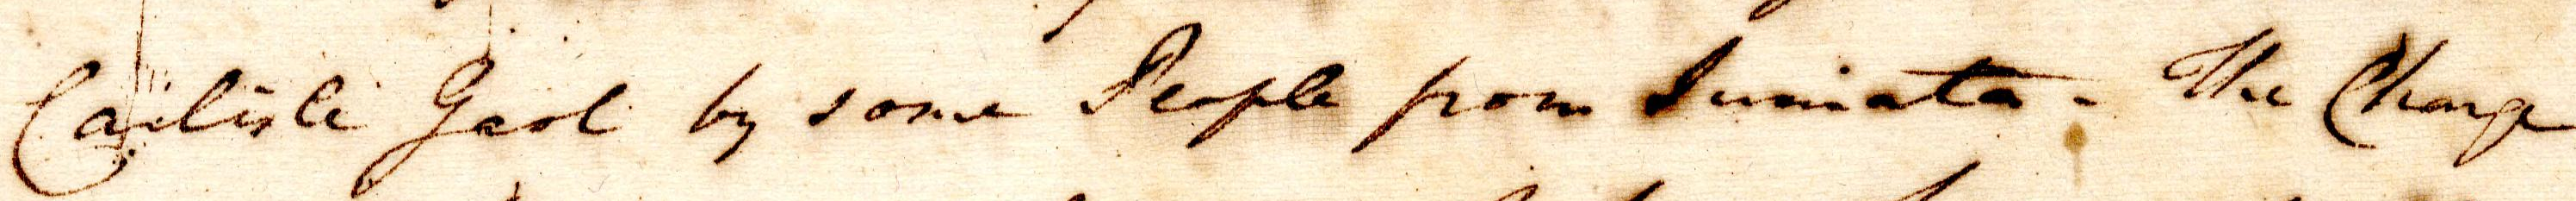Carlisle Gaol by some People from Juniata. The Charge
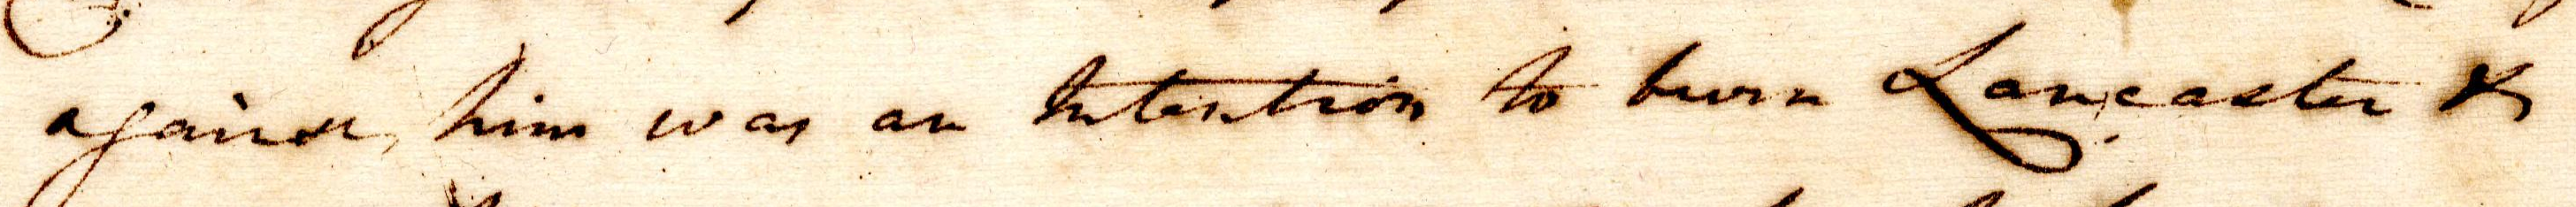against him was an Intention to burn Lancaster &
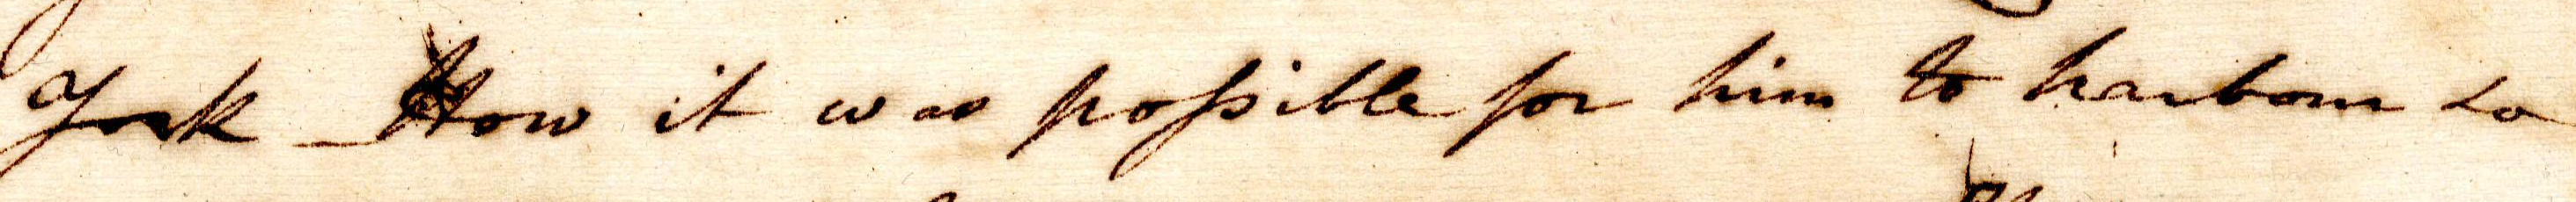York- How it was possible for him to harbour so
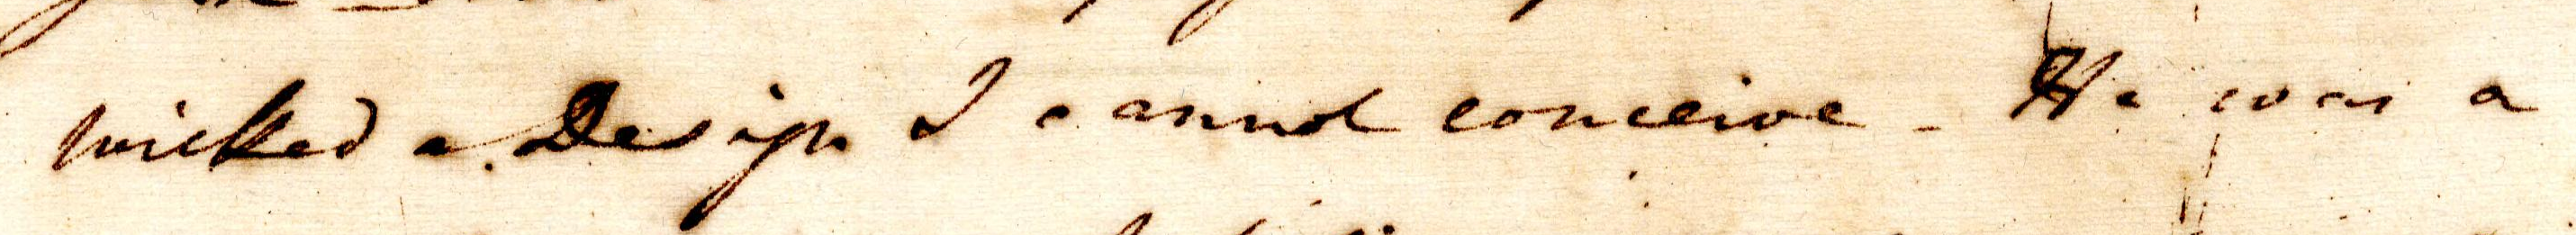wicked a Design I cannot conceive- He was a
